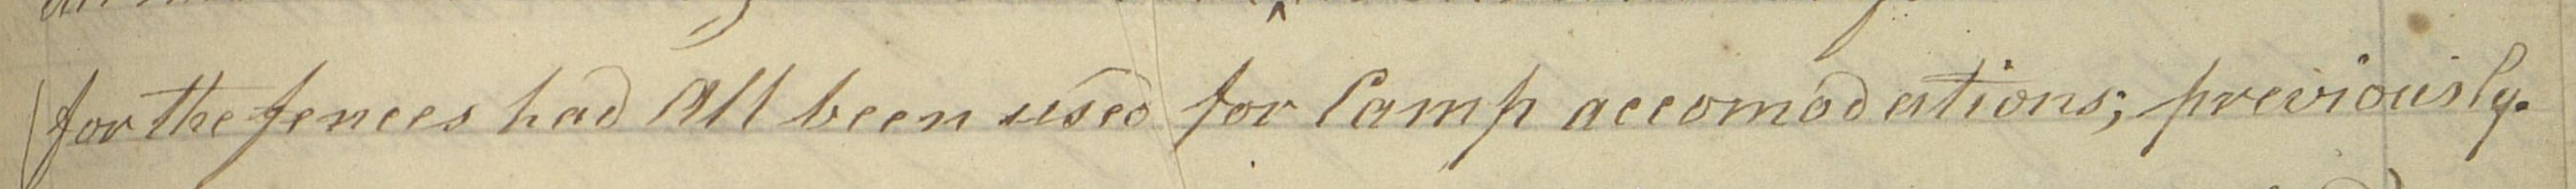(for the fences had All been used for Camp accomodations; previously.
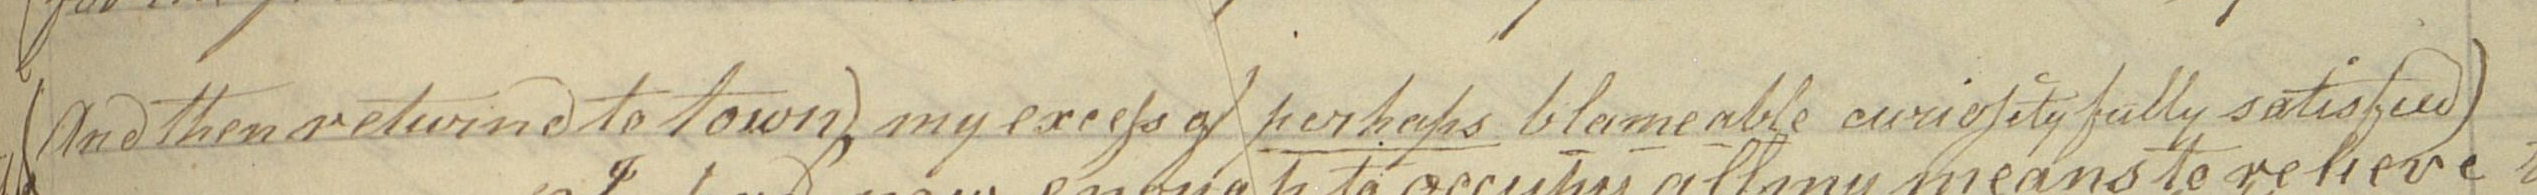(And then returnd to town), my excess of perhaps blameable curiosity fully satisfied)
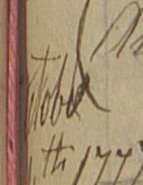Octob
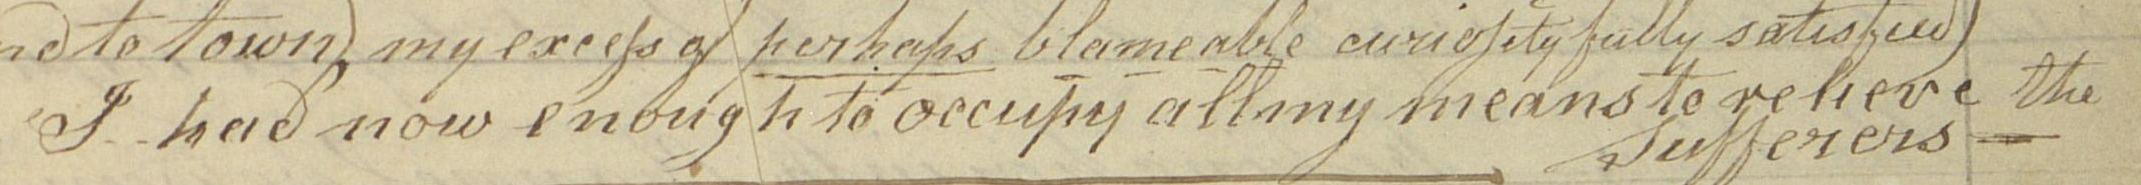I had now enough to occupy all my means to relieve the
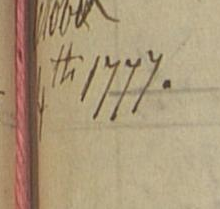4^th 1777.
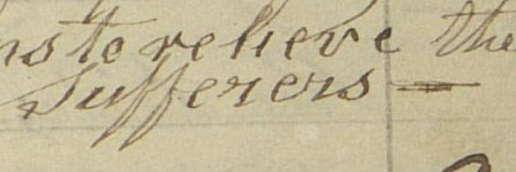Sufferers
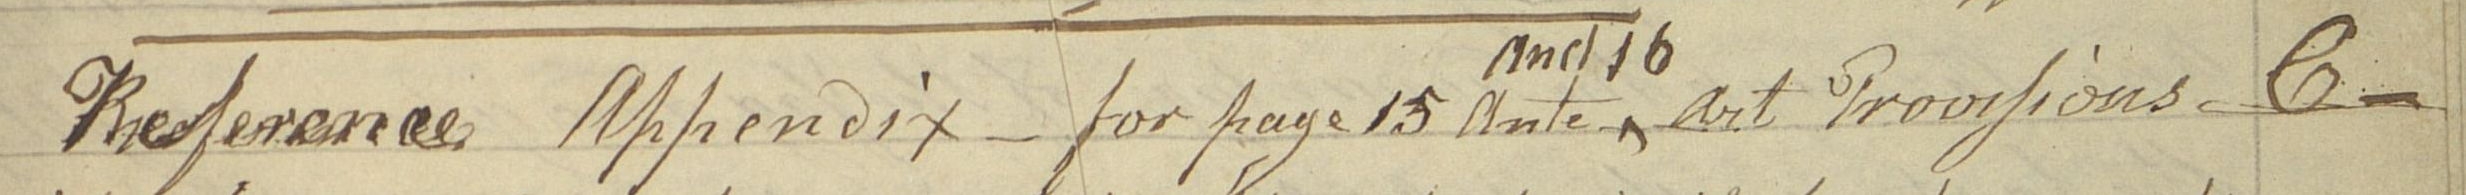Reference Appendix for page 15 Ante ^ art Provisions C
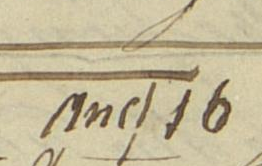and 16
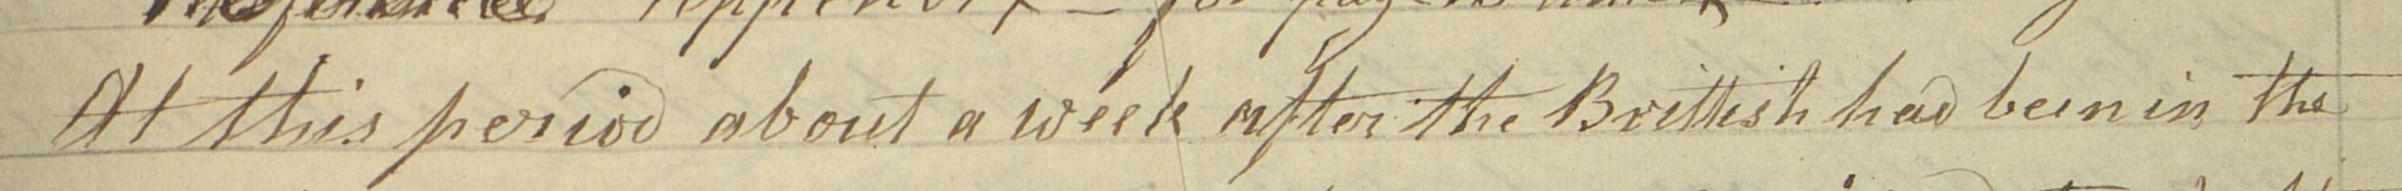At this period about a week after the Brittish had been in the
